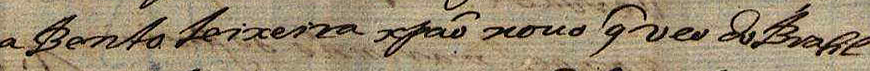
a Bento teixeira xpaõ nouo q veo do Brasil
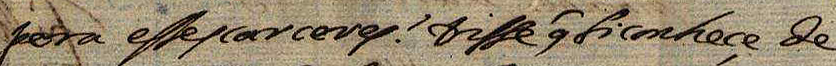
pera estes carceres? Disse q̄ si conheçe de
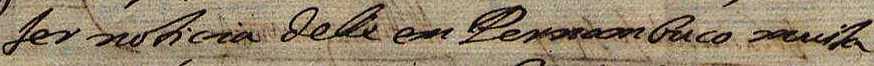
ter notiçia delle em Pernambuco muita
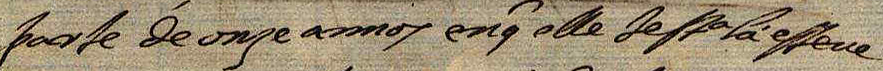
parte de onze anos en q̄ elle testa lá esteue
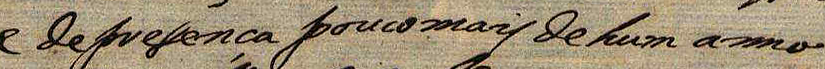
e de preença pouco mais de hum anno
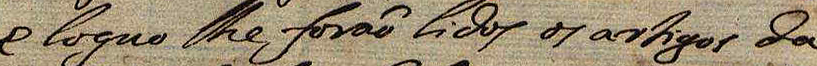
E loguo lhe foraõ lidos os artigos da
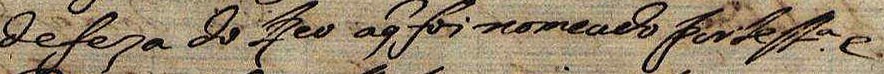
defeza do Reo a q̄ foi nomeado por testa. e
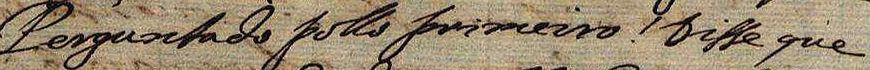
Perguntado pollo primeiro? Disse que
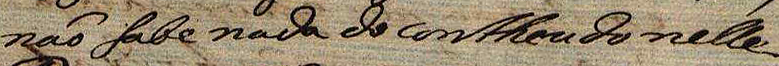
naõ sabe nada do contheudo nelle
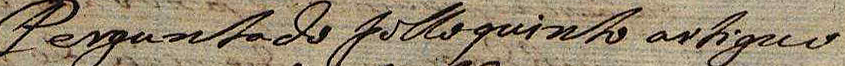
Perguntado pollo quinto artiguo
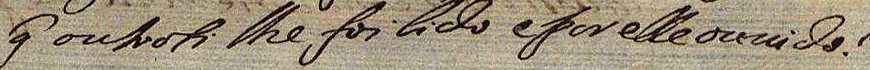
q̄ outrosi lhe foi lido e por elle ouvido?
